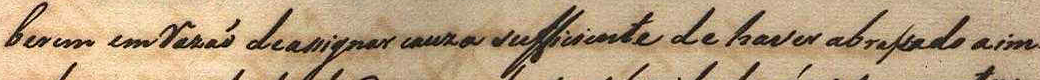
berem em Razaõ de assignar couza sufficiente de haver abrassado a im
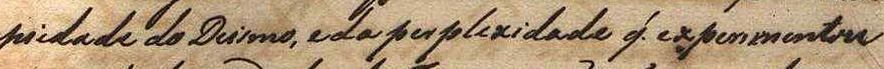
piedade do Deismo, e da perplexidade q̄ experimentou
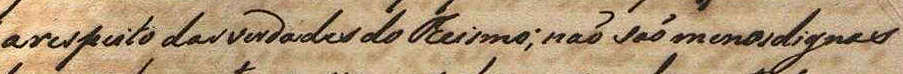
a respeito das verdades do Theismo; naõ saõ menos dignas
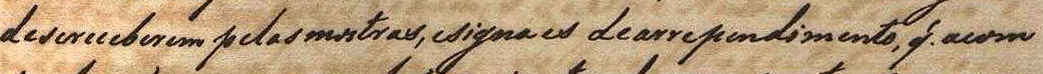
de se receberem pelas mostras, e signaes de arrependimento, q̄ acom
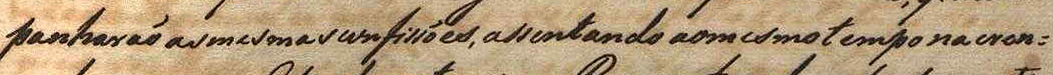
panharaõ as mesmas confissões, assentando ao mesmo tempo na cren
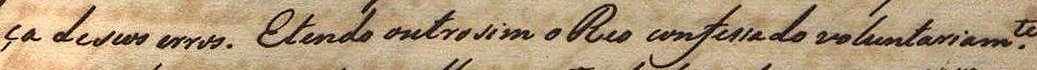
ça de seos erros. E tendo outrosim o Reo confessado voluntariam.te
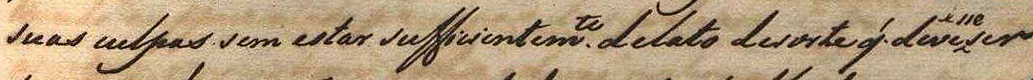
suas culpas sem estar sufficientem.te delato de sorte q̄ devesse ser
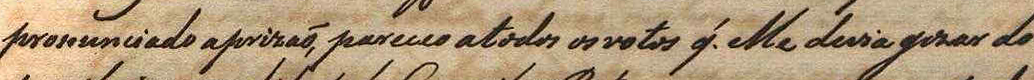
pronunciado a prizaõ, pareceo a todos os votos q̄ elle devia gozar do
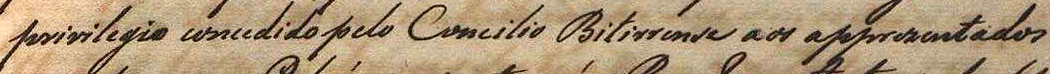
privilegio concedido pelo Concilio Bitirrense aos apprezentados
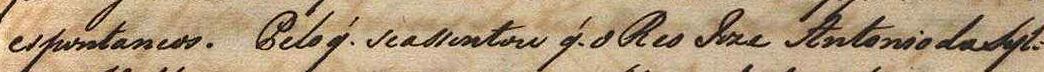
espontaneos. Pelo q̄ se assentou q̄ o Reo Ioze Antonio da Syl
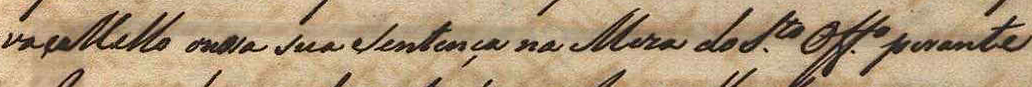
va, e Mello oussa sua sentença na Meza do S.to Off.o perante
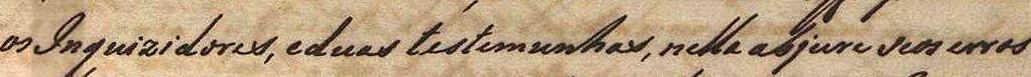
os Inquizidores, e duas testemunhas, nella abjure seos erros
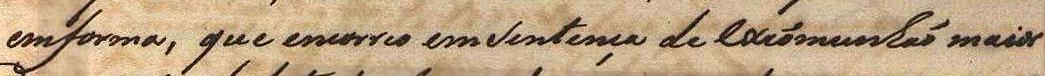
em forma, que encorreo em sentença de Excomunhaõ maior
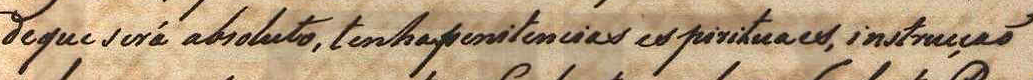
de que será absoluto, tenha penitencias espirituaes, instruççaõ
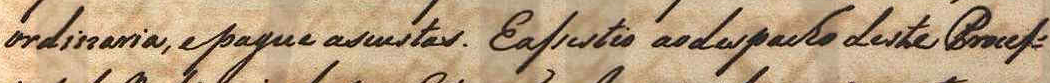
ordinaria, e pague as custas. E assestio ao despacho deste Proces
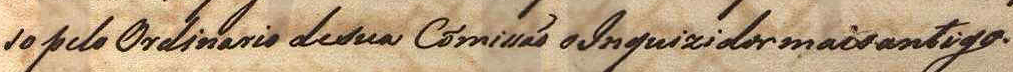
so pelo Ordinario de sua Cōmissaõ o Inquizidor mais antigo.
